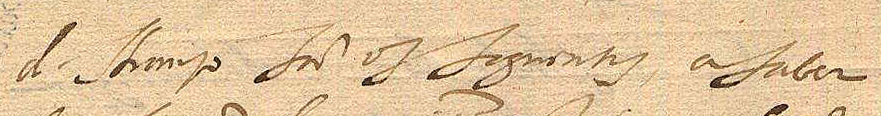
d. Araujo sā os seguintes, a saber
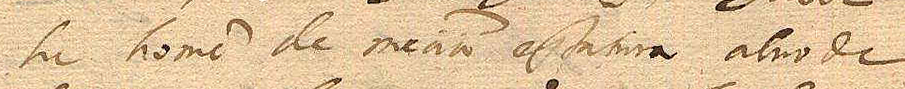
he homē de meāa estatura aluo de
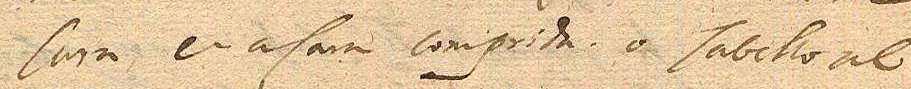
Cara, e a Cara comprida. o Cabello al
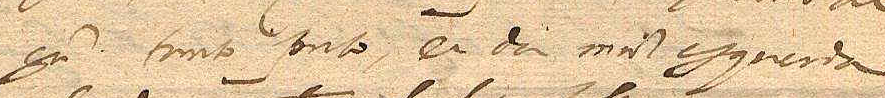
gū tanto parco, e da mā esquerda
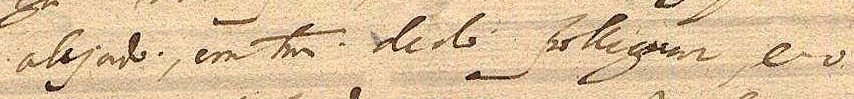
alejado, em hū dedo polleguar, e o
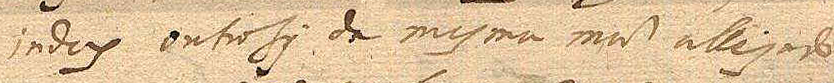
index outrosy da mesma mā aleijado
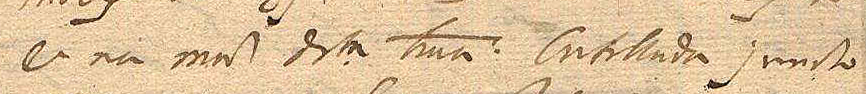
e na mā dr.ta h̄ua Cutellada juncto
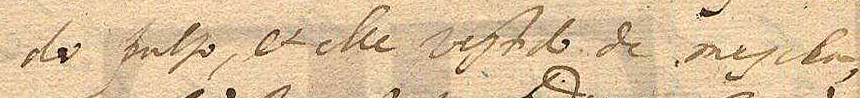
do pulso, & elle vestido de mescla,
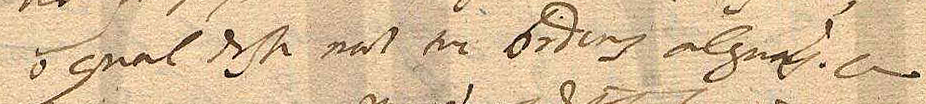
o qual disse naõ ter ordens alguās. e
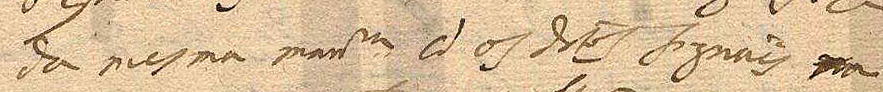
da mesma manra cō os ditos signais na
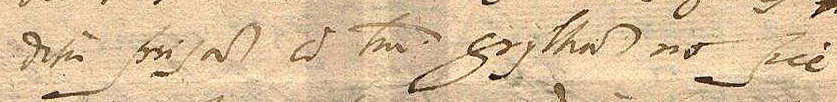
dita prisaõ cō h̄u grjlhā no pie
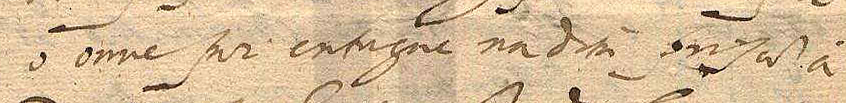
o ouue por entregue na dita prisaõ a
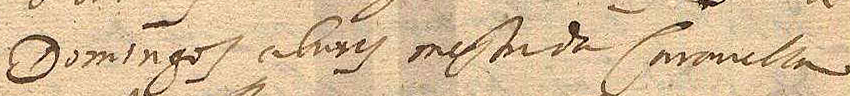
Domingos alures mestre da Carauella
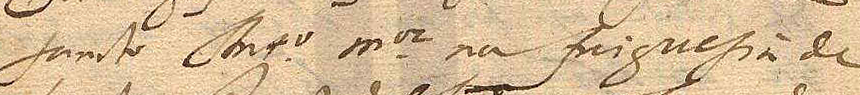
sancto Ant.o mor na freiguesia de
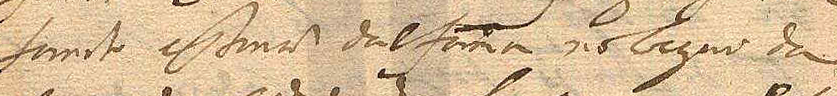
sancto esteuā dalfama no lugar da
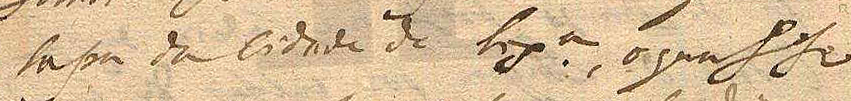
lapa da cidade de lix.a, o qual se
